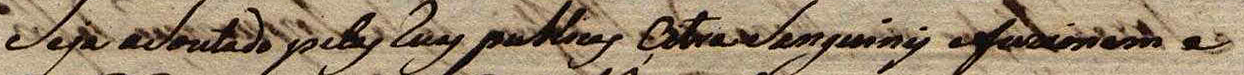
Seja asoutado pelas Ruas publicas Çitra Sanguinis efuzionem e
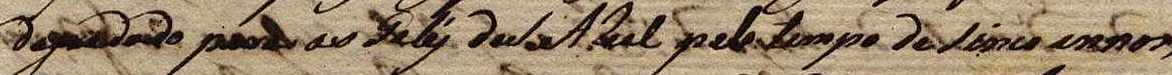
degradado para as Galés da S. A. Real pelo tempo de sinco annos,
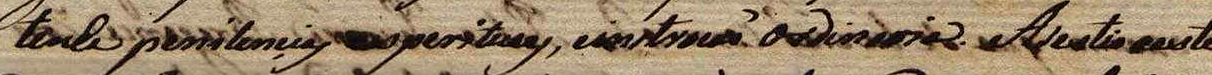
tendo penitencias _sperituaes, e instroçaõ ordinaria. Asestio a este
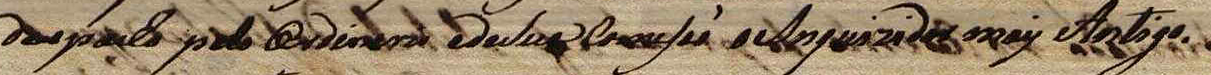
despacho pelo Ordinario e da Sua Comisaõ o Inquizidor mais Antigo.
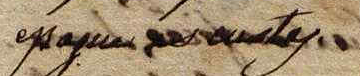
e pague as custas.
